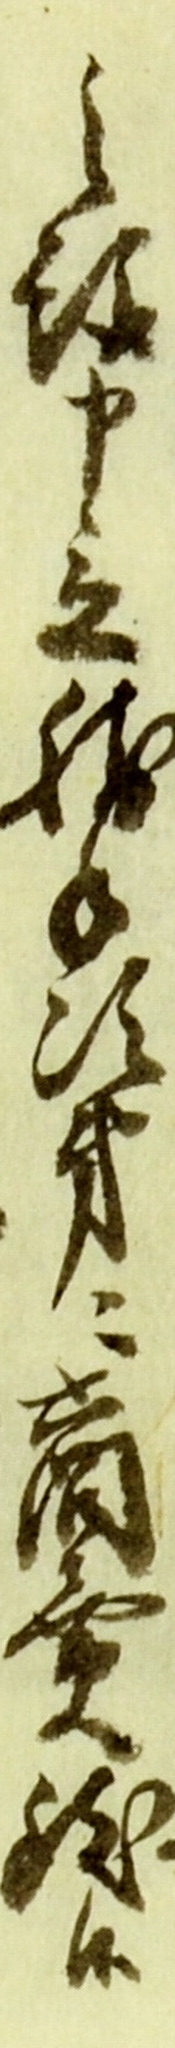之趣申立勝手次第ニ商売致候
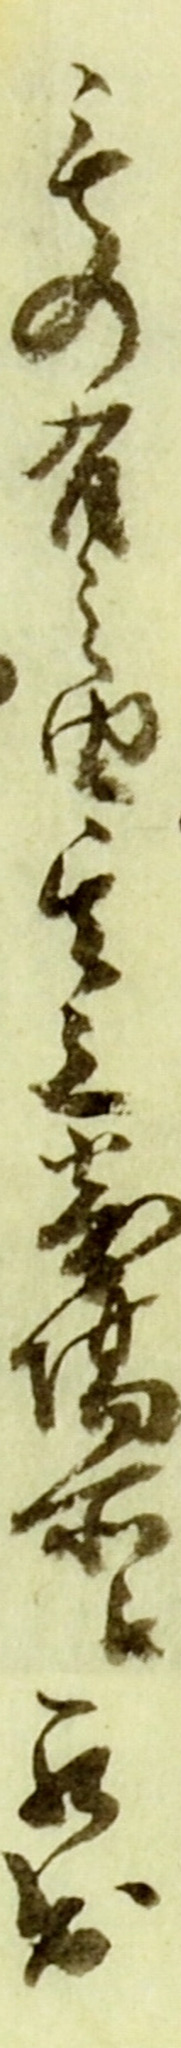もの有之由其上寄場所江罷出
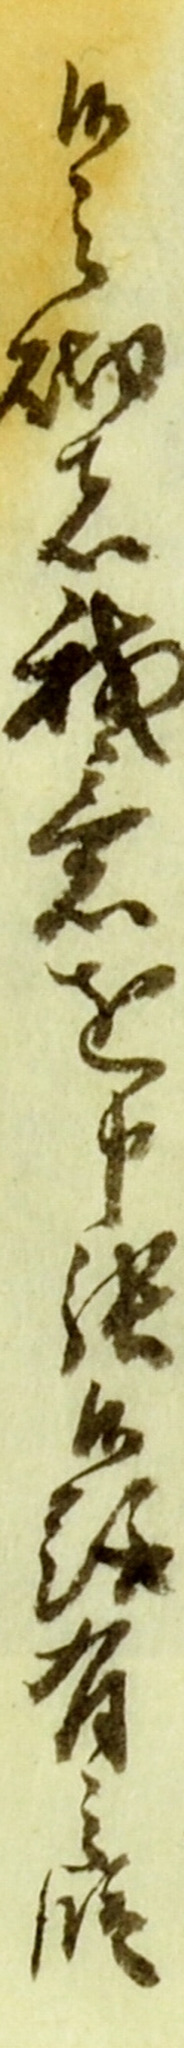候之砌者我意を申張候趣有之段
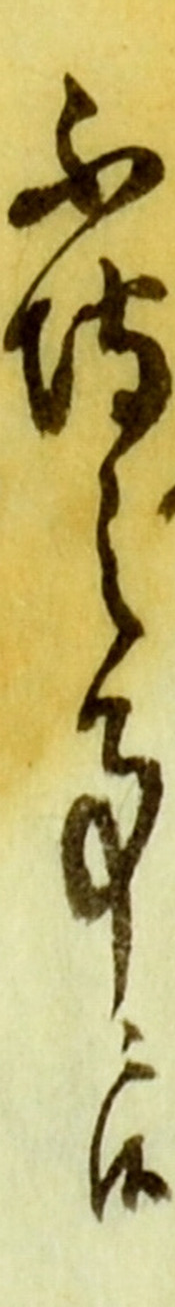不埒之事ニ候

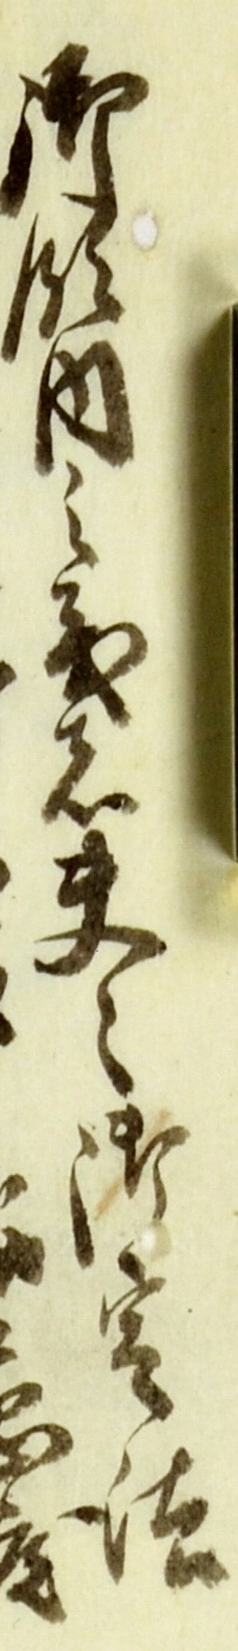御領内之義者夫々御定法
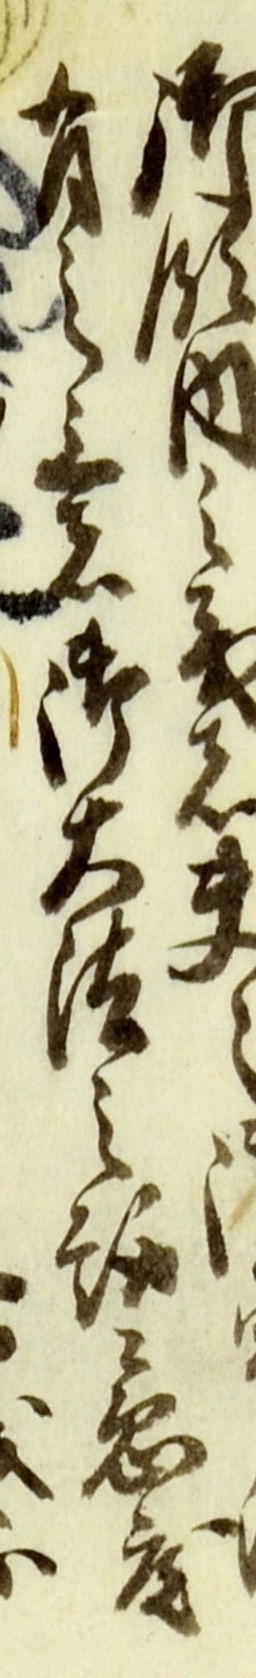有之上者御大法之趣急度
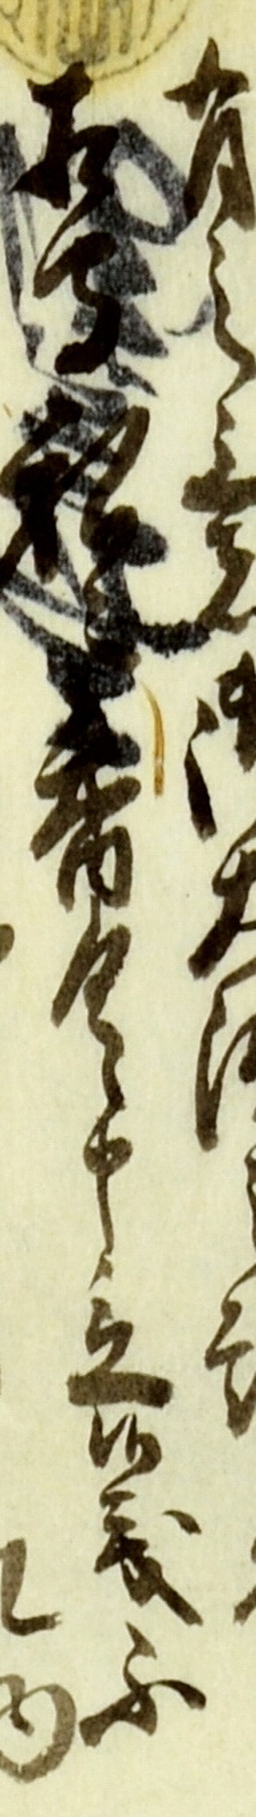相守私ニ香具申立候義不
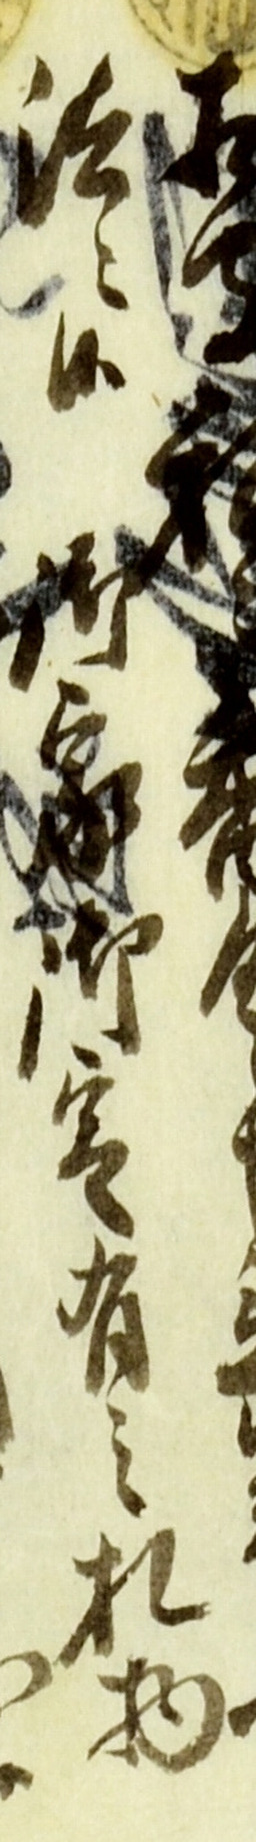法ニ候御家御定有之札物
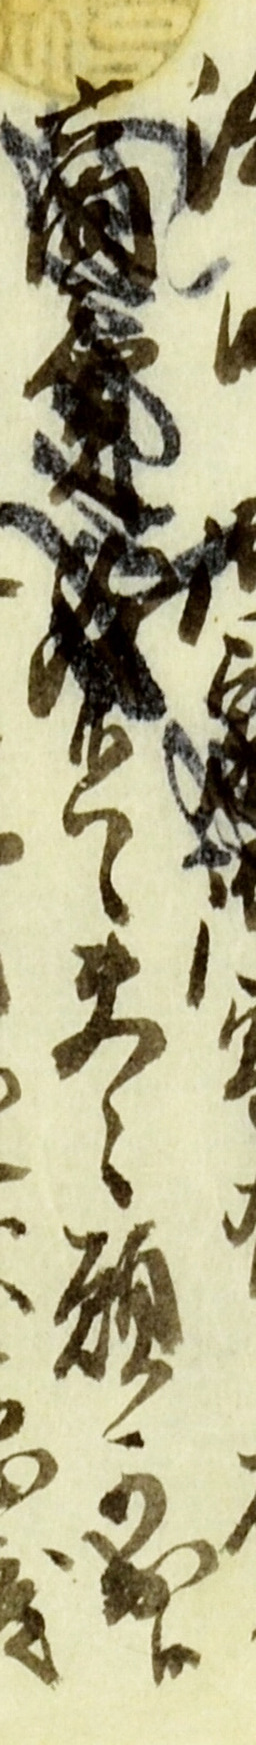商売致候ハゝ夫々願可出候
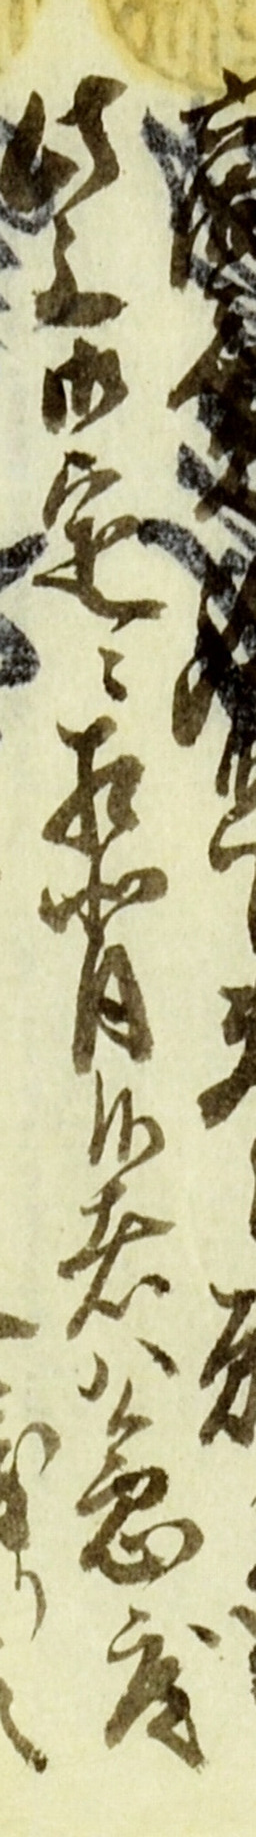此上御定ニ相背候者ハ急度
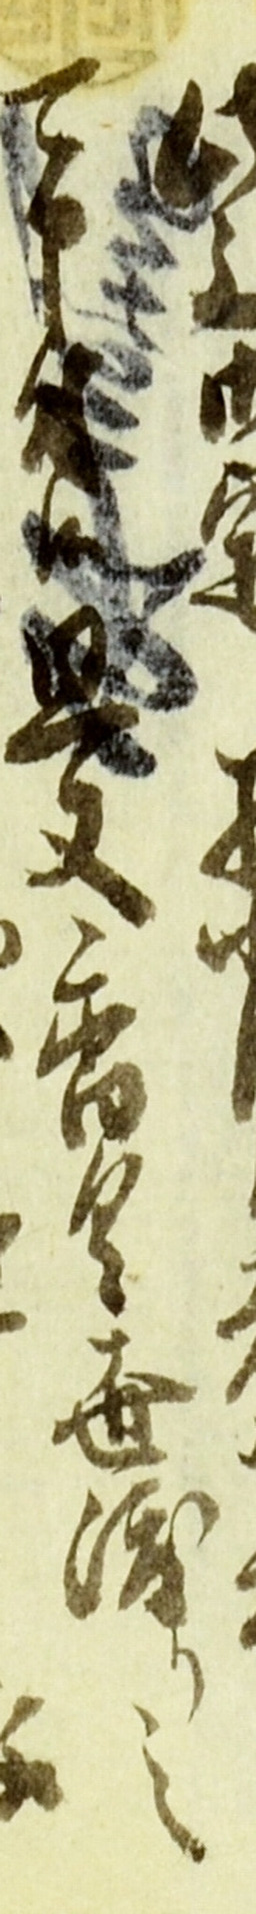可申付候且又香具世渡り之
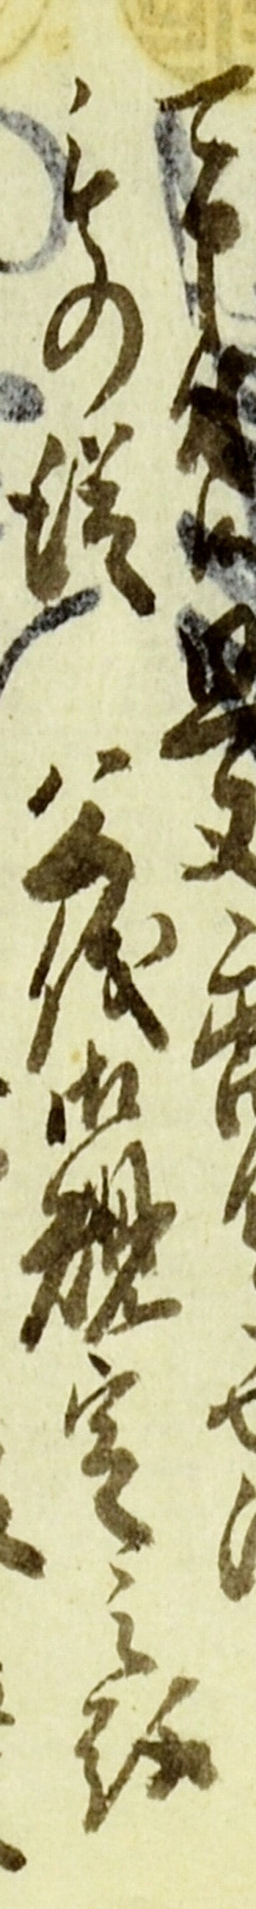もの従公儀御規定之趣
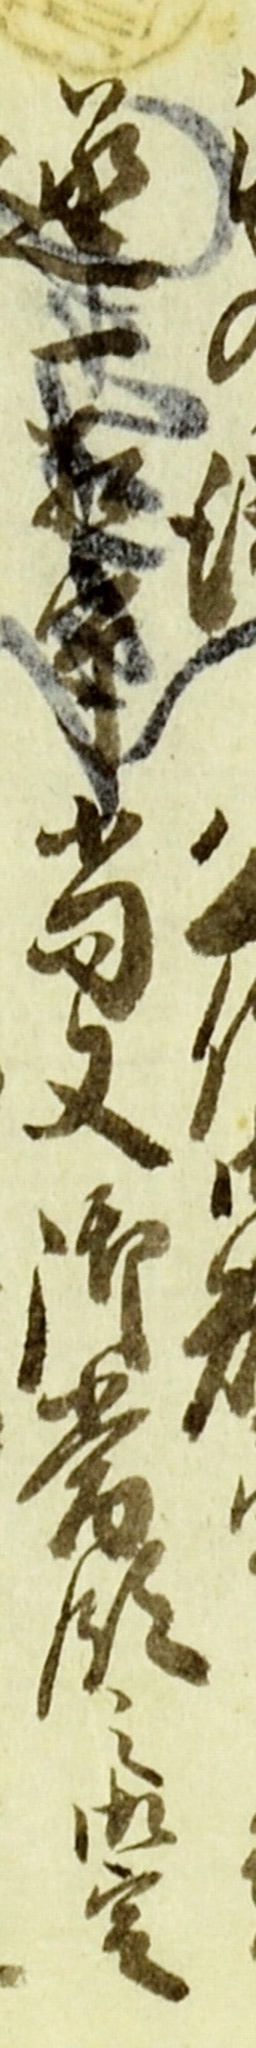逐一相守尚又御当領之御定
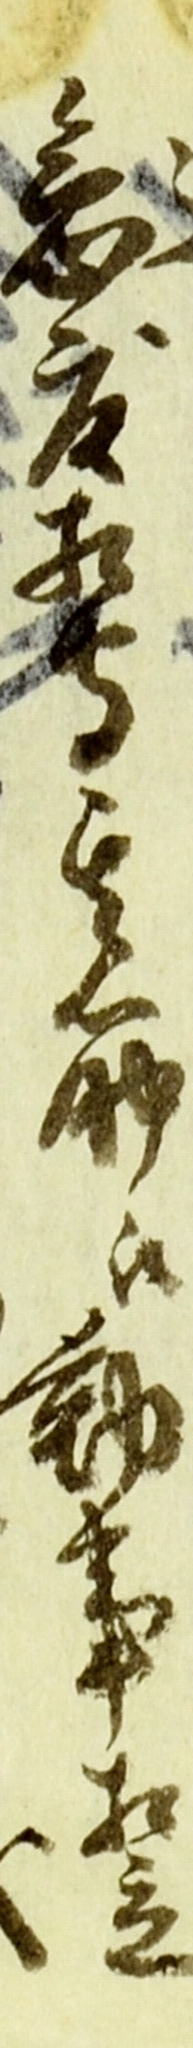急度相守其筋江勤事相立
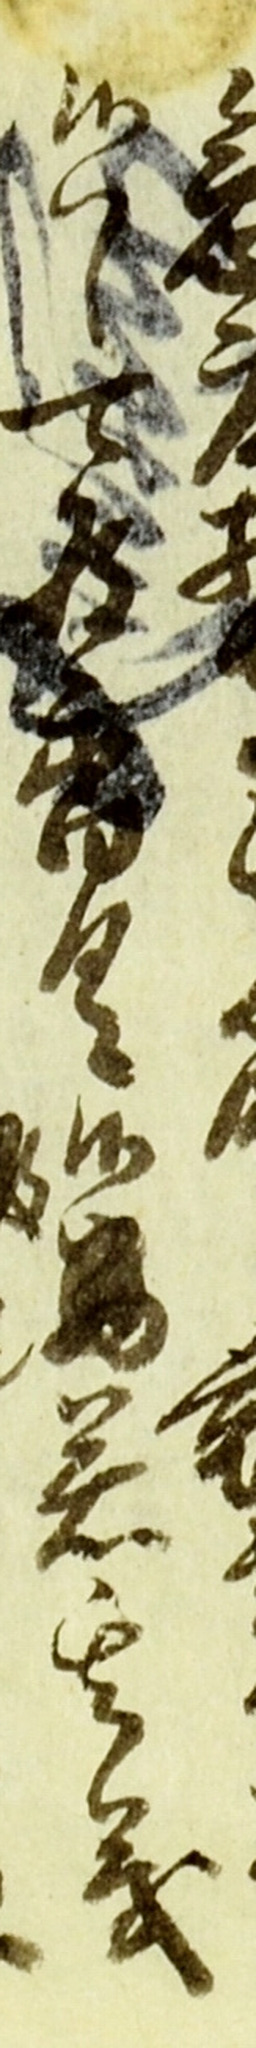候ハゝ可為香具候若其義
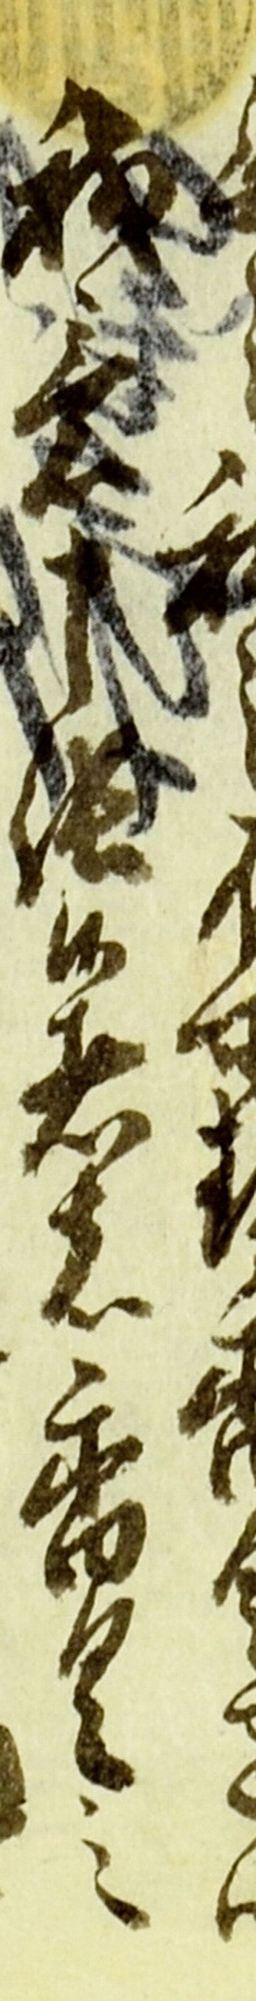我意申張候者者香具之
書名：分一方諸運上御定法
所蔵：伊那市立高遠町図書館・合同会社AMANE
